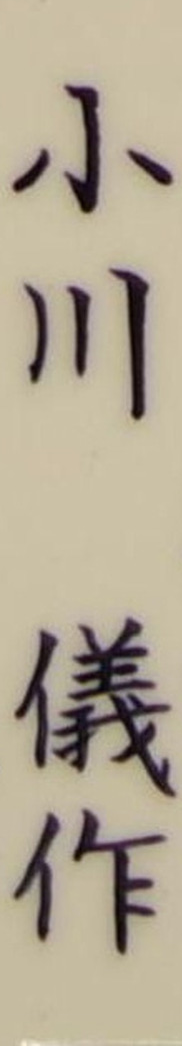小川儀作
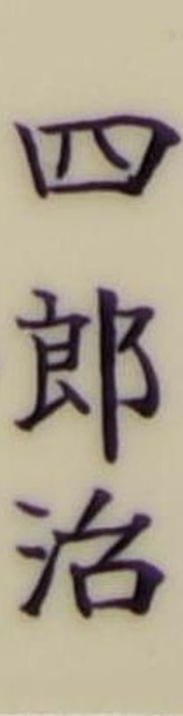四郎治
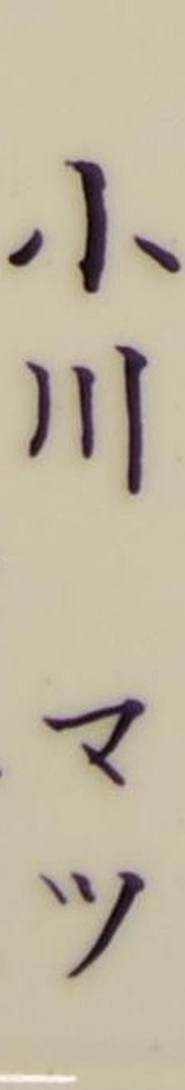小川マツ
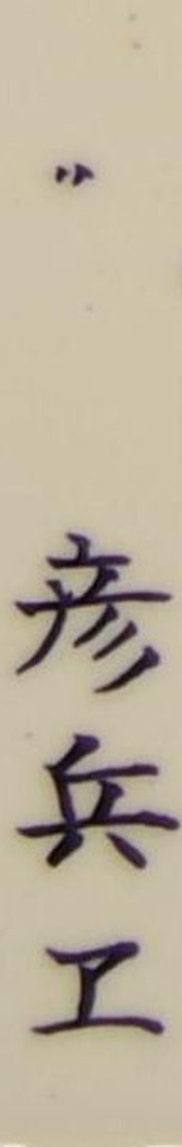彦兵ヱ
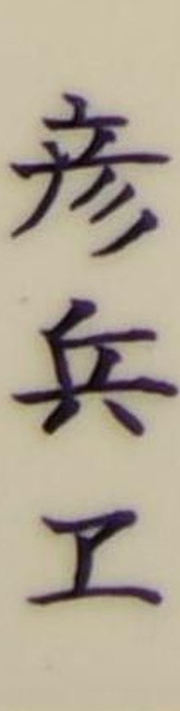彦兵ヱ
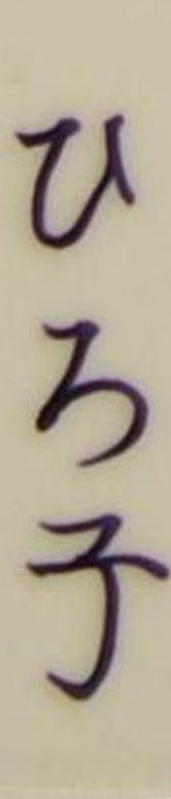ひろ子
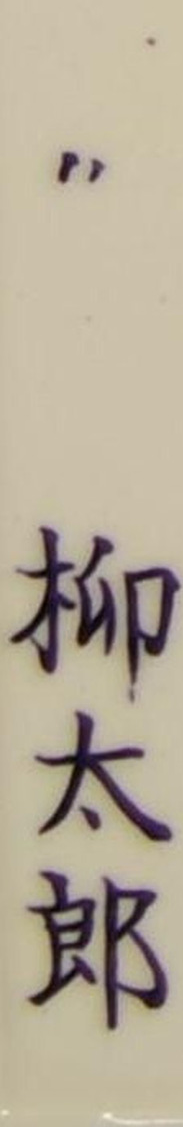柳太郎
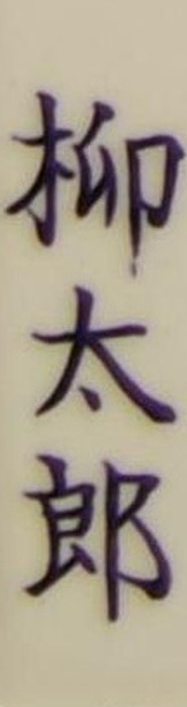柳太郎

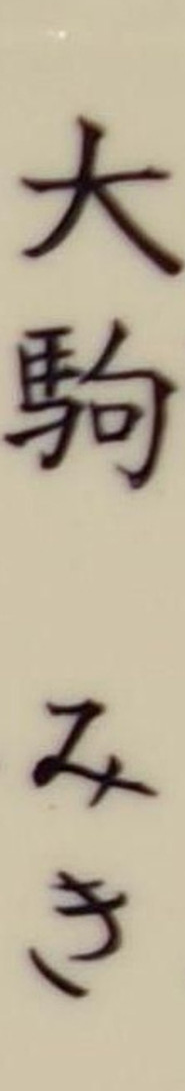大駒みき
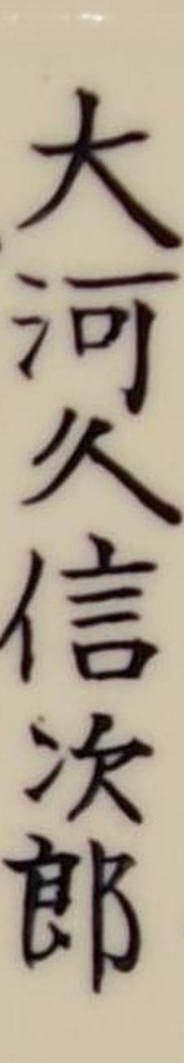大河久信次郎
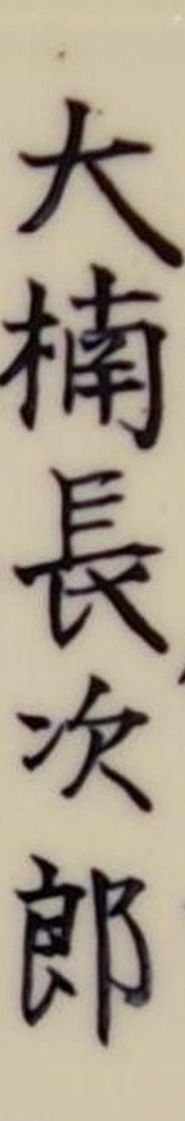大楠長次郎
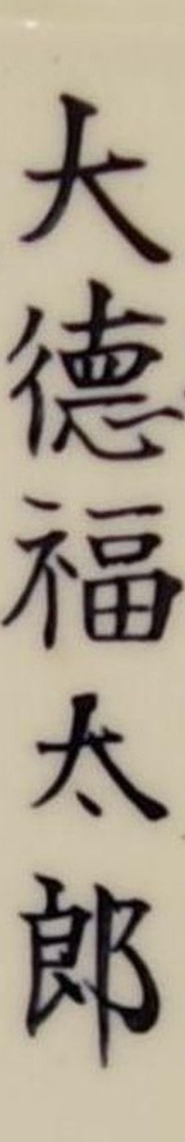大徳福太郎
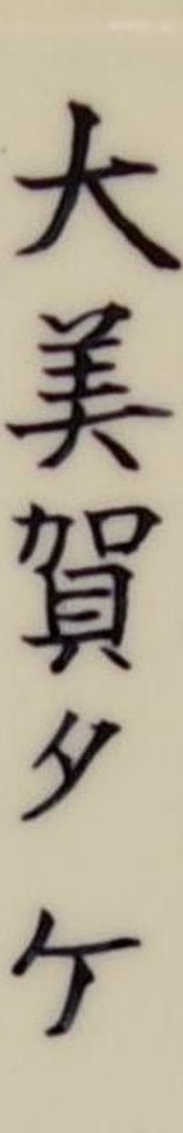大美賀タケ
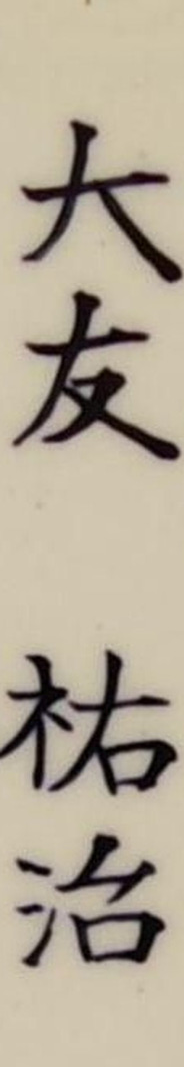大友祐治
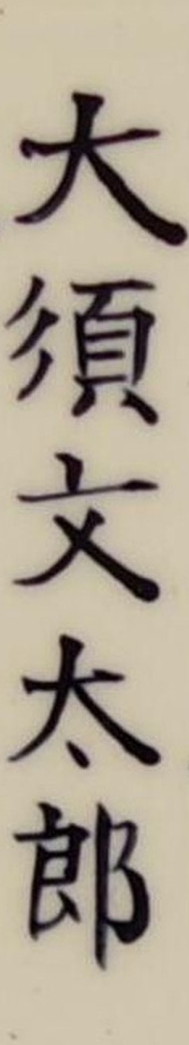大須文太郎
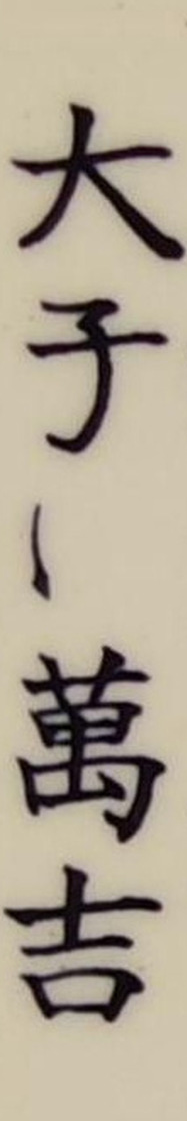大子万吉
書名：A~D
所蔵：koyasan kongobuji
